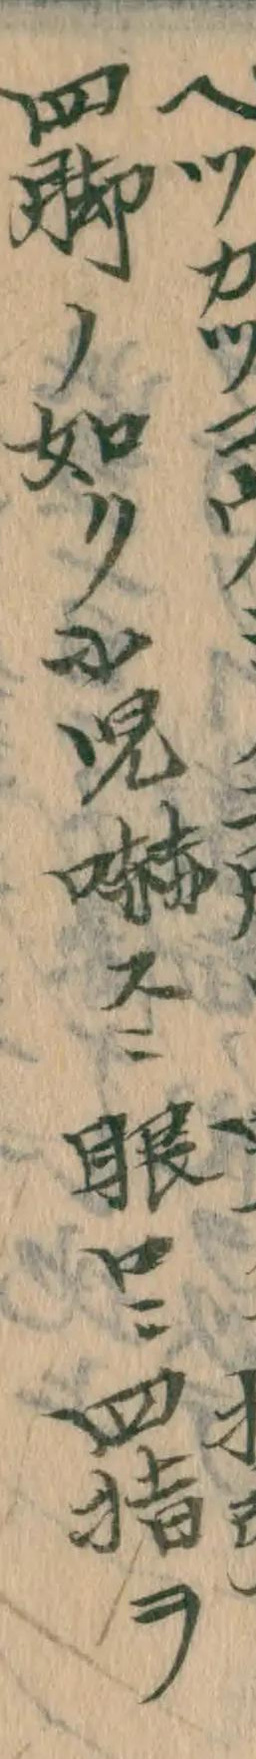四脚ノ如ク小児嚇スニ眼口ニ四指ヲ
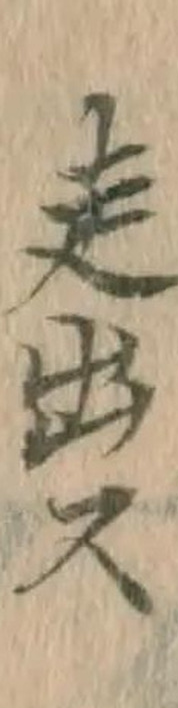走出ス
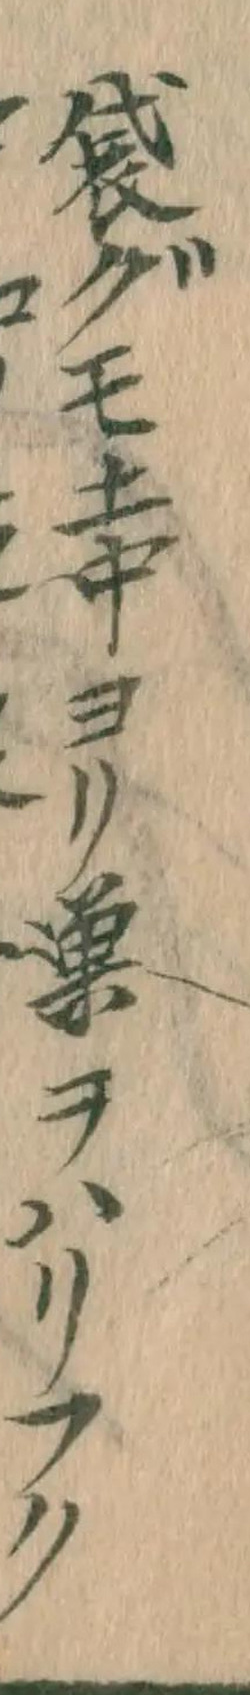袋グモ土中ヨリ巣ヲハリフク
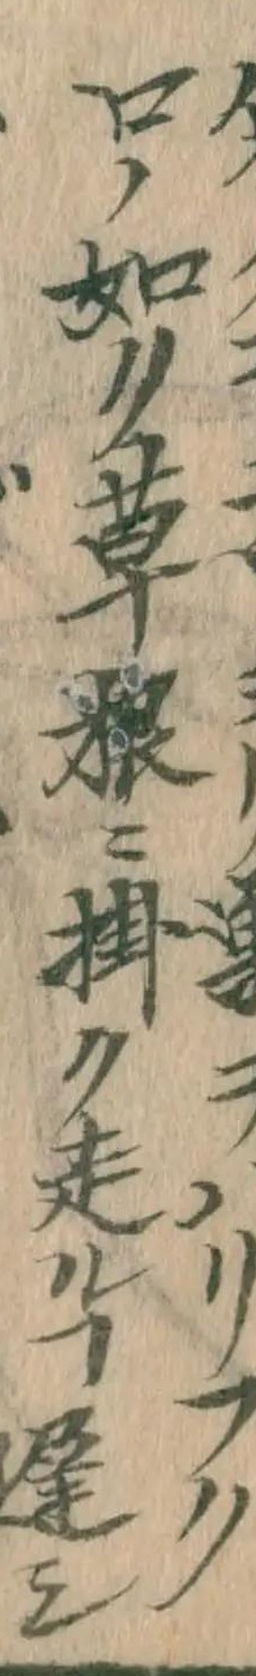ロノ如ク草根ニ掛ク走ルコト遅シ
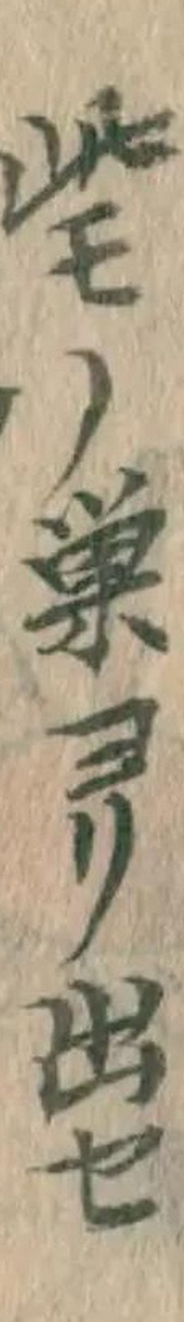此モノ巣ヨリ出セ
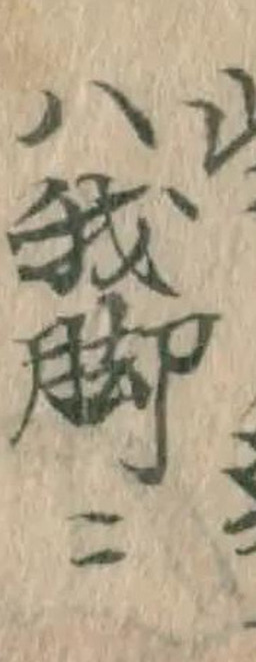ハ我脚ニ
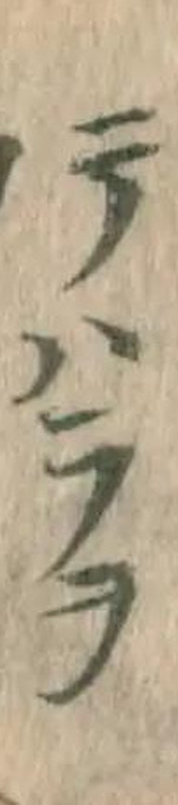テハラヲ
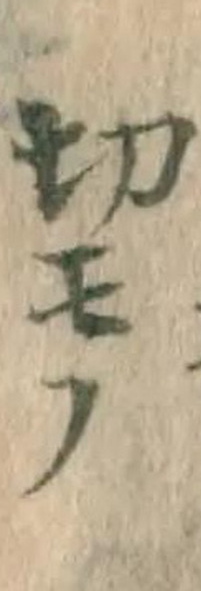切モノ
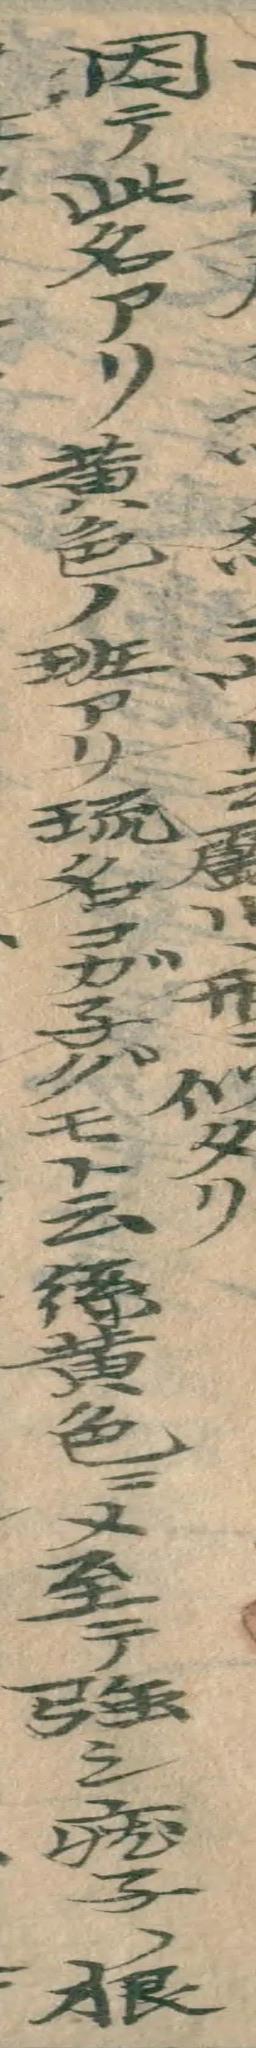因テ此名アリ黄色ノ班アアリ琉名コガネグモト云絲黄色ニシテ至テ強シ疣子ノ根
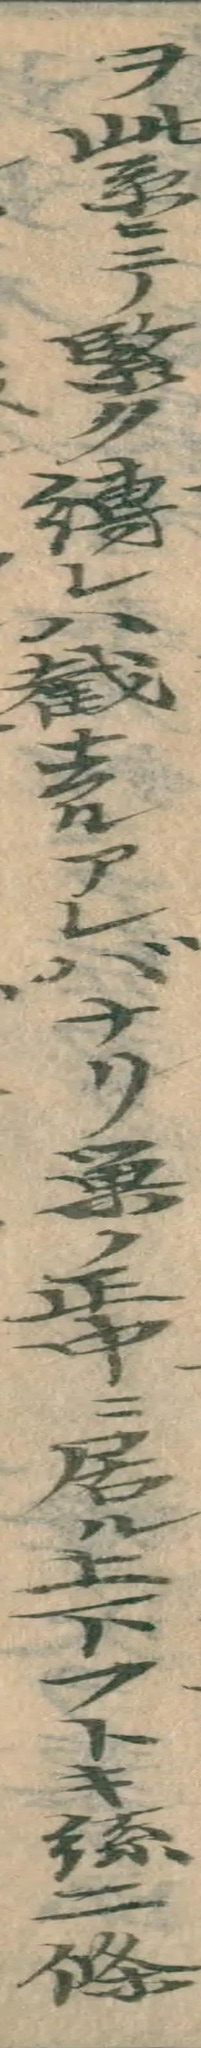ヲ此糸ニテ緊ク縛レハ截去ルアレバナリ巣ノ正中ニ居ル上下フトキ絲ニ條
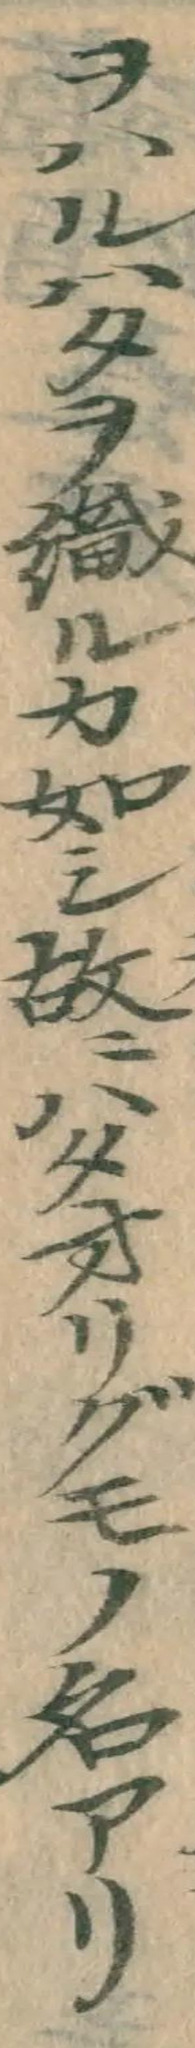ヲハルハタヲ織ルカ如シ故ニハタオリグモノ名アリ

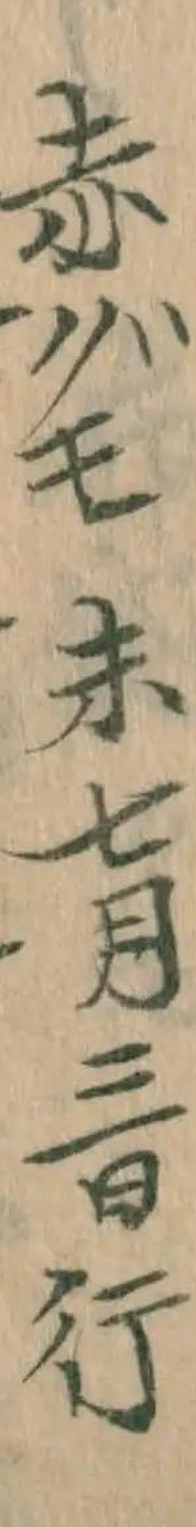赤グモ未七月三日行
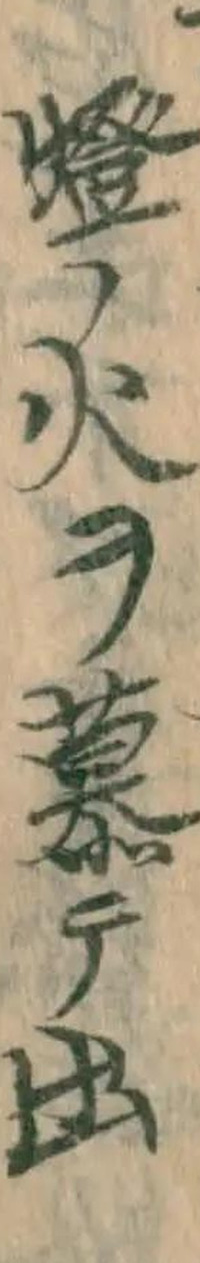燈ノ火ヲ慕テ出
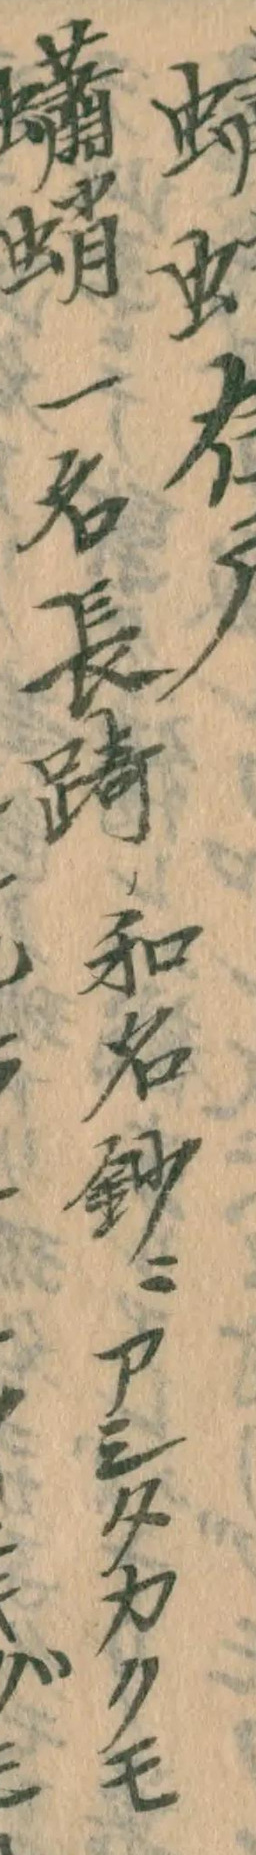蠨蛸一名長踦和名鈔ニアシタカクモ
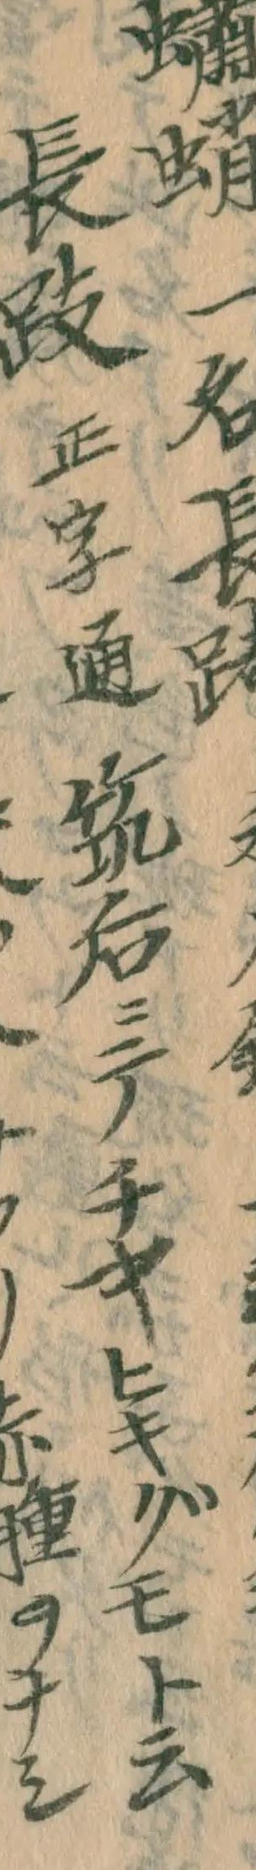長跂正字通筑后ニテチヤヒキグモト云
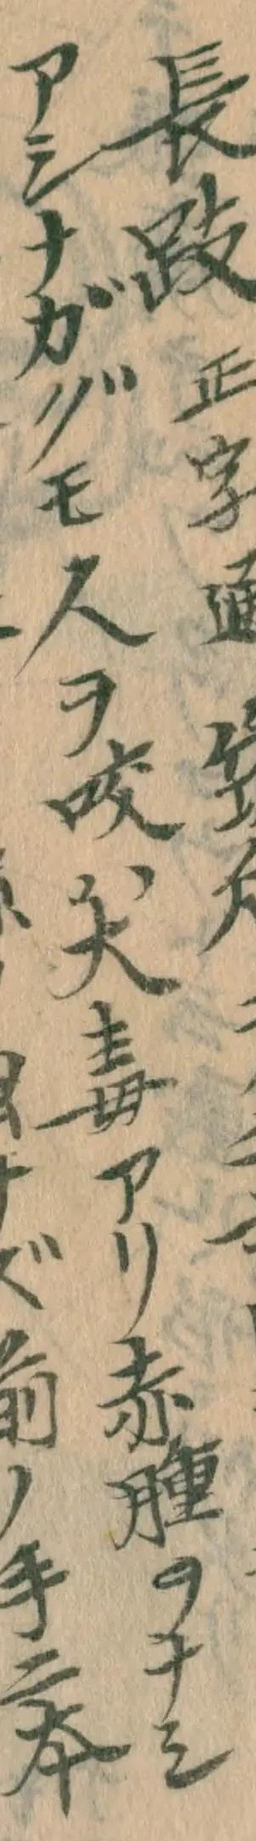アシナガグモ人ヲ咬ハ大毒アリ赤腫ヲナシ
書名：千蟲譜 3巻. [2]
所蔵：国立国会図書館 National Diet Library, JAPAN
